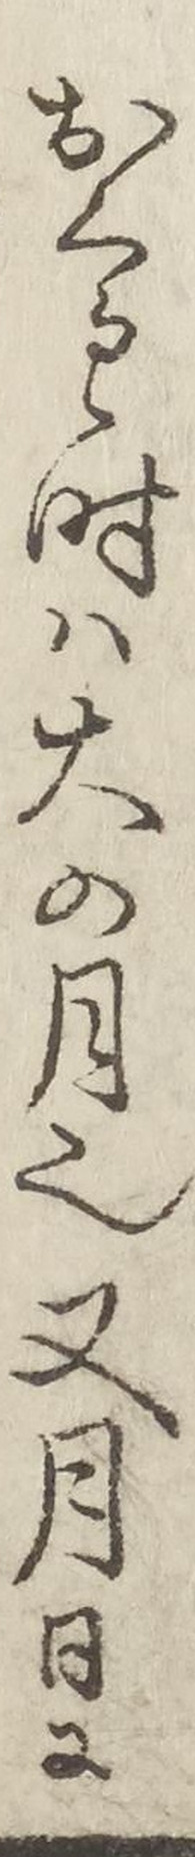おくるゝ時は大の月也又月日に
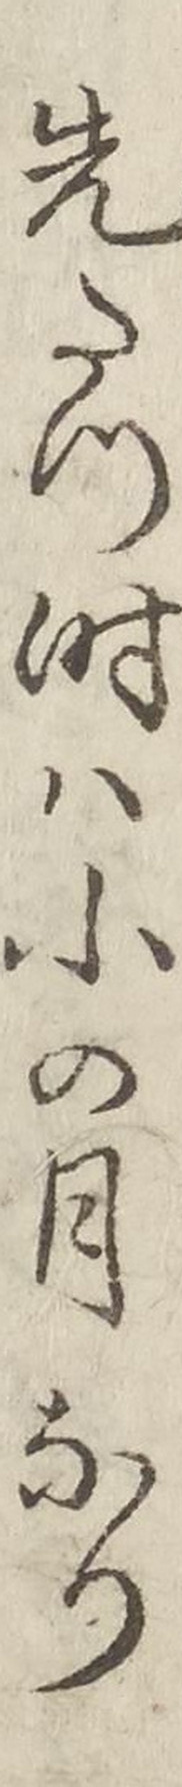先たつ時は小の月なり
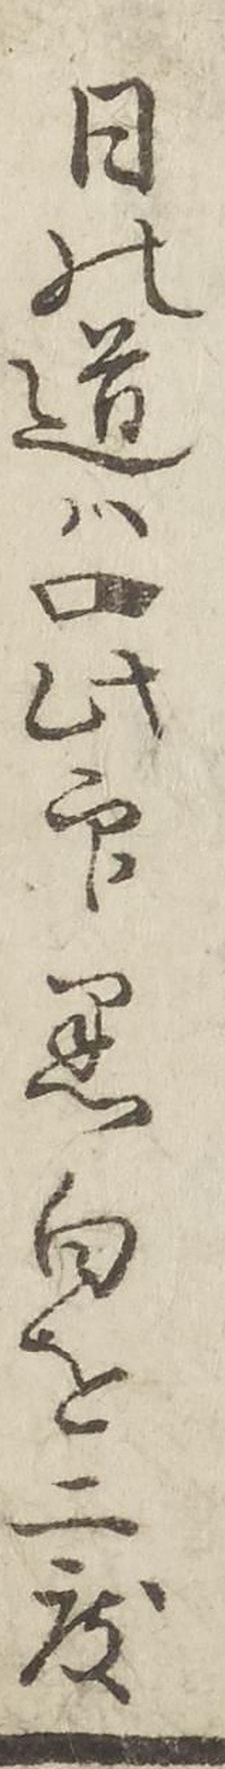日の道は此印黒白を二度
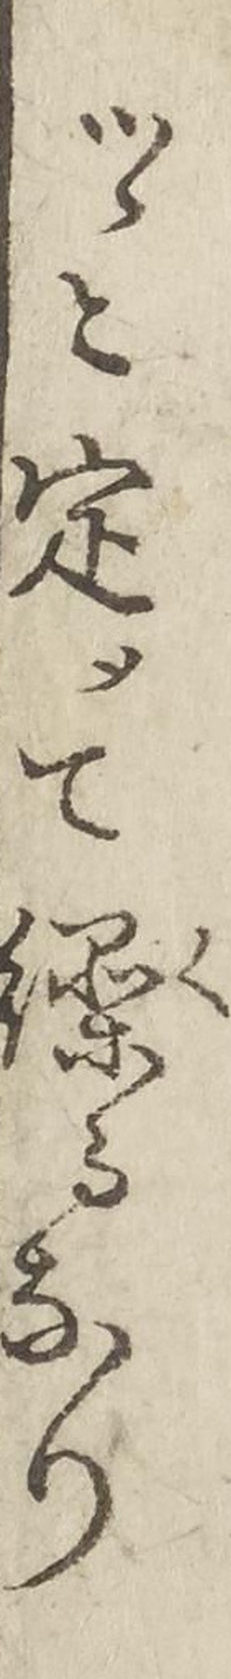つゝと定メて繰るなり

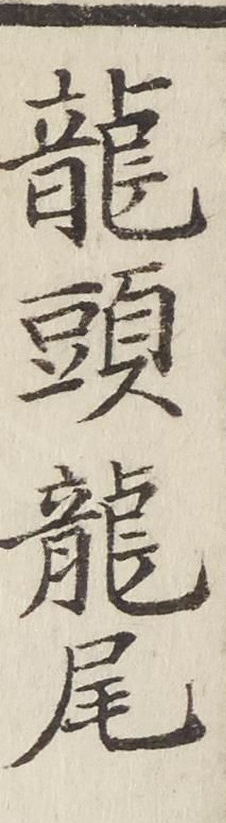龍頭龍尾
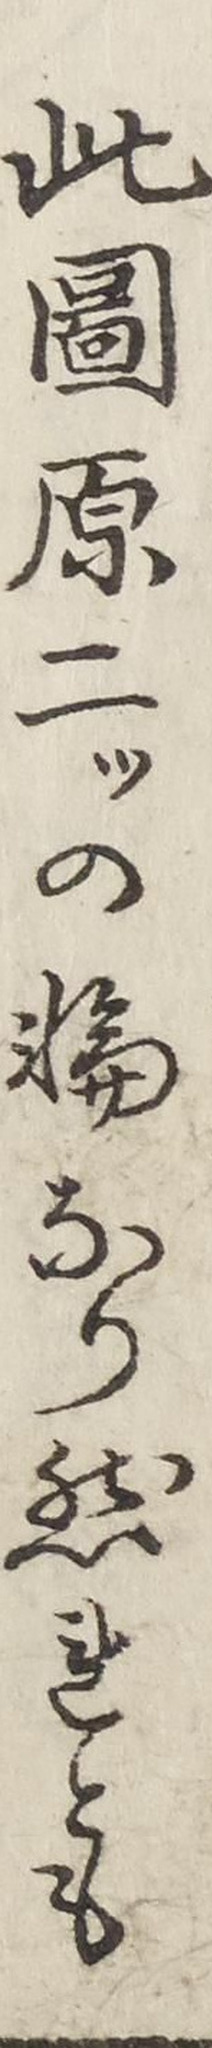此図原二ツの輪なり然れとも
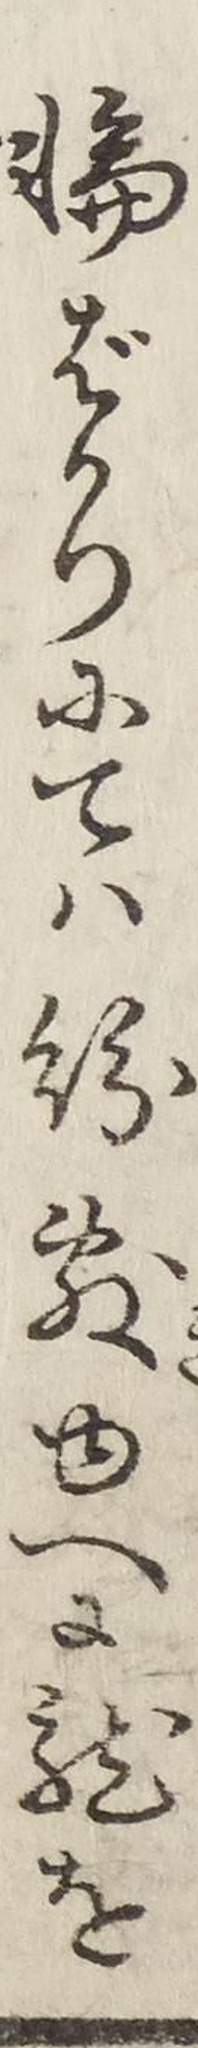輪ばかりにては紛敷ゆへに龍を
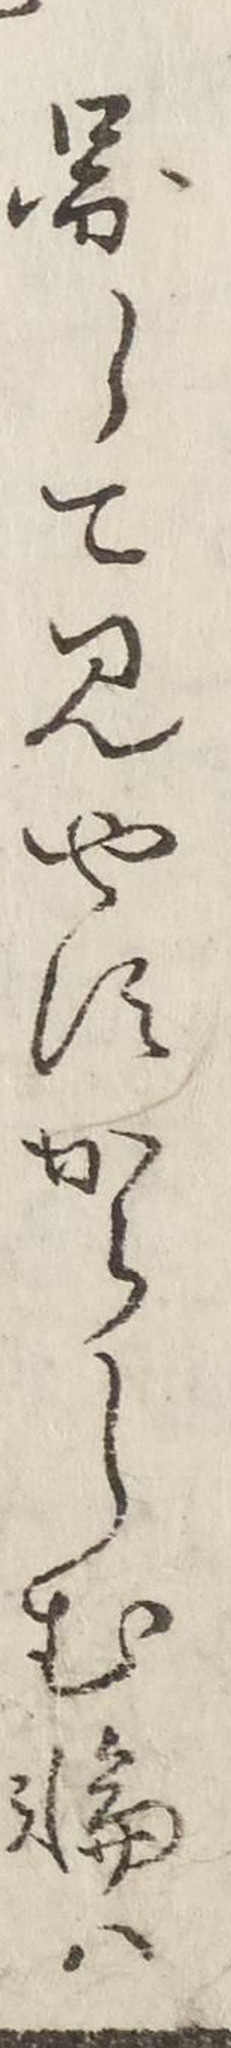図して見やすからしむ輪は
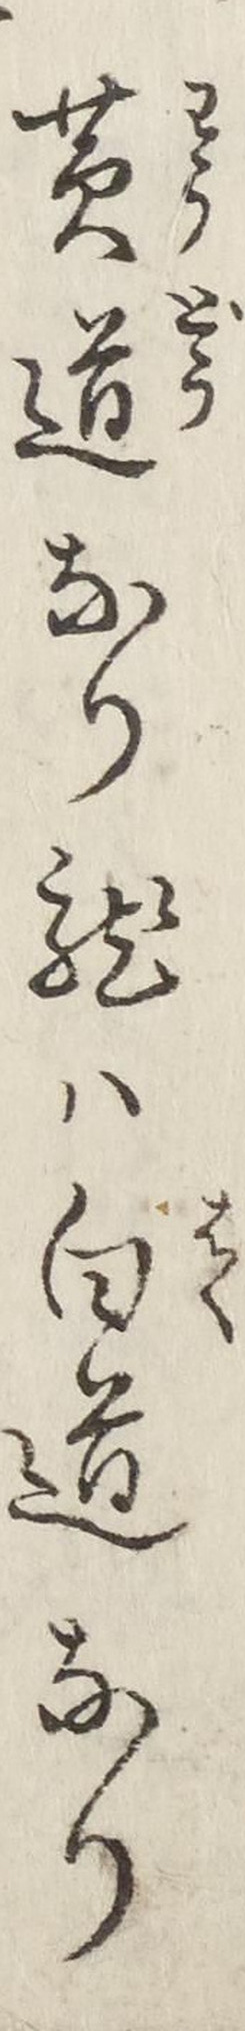黄道なり龍は白道なり
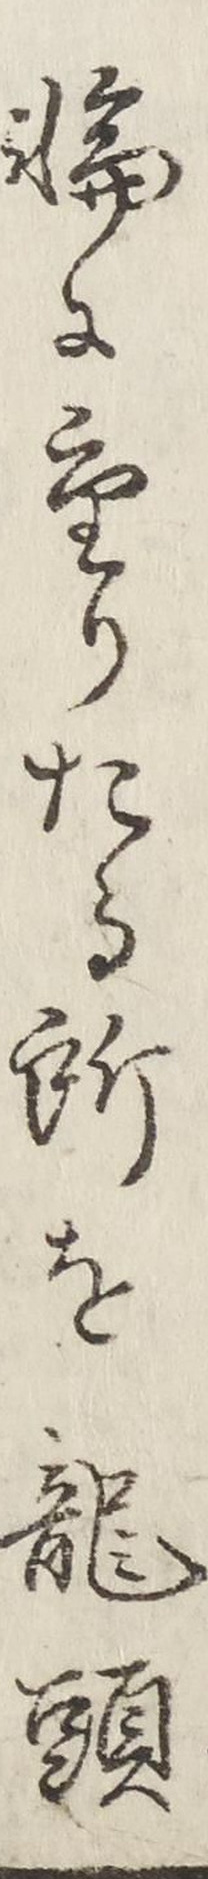輪に重りたる所を龍頭
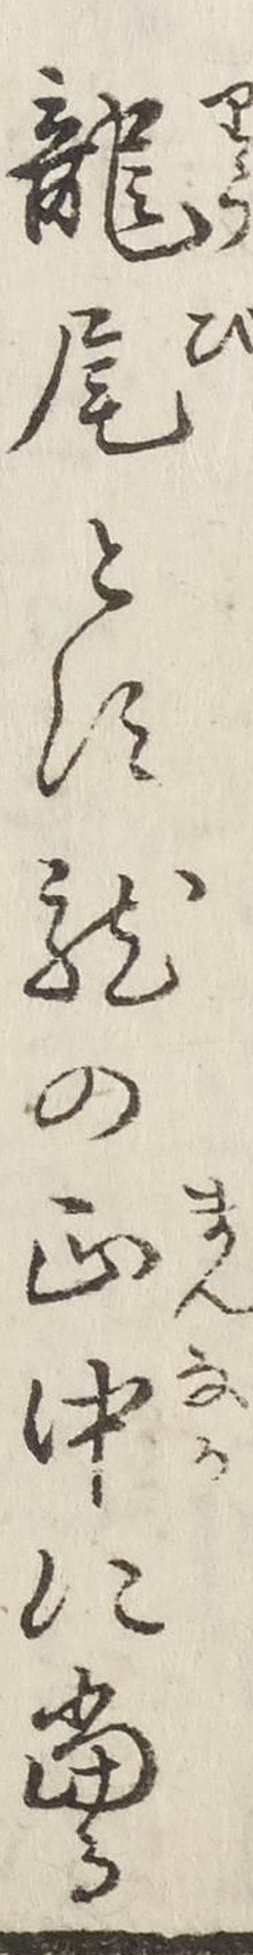龍尾とす龍の正中に当る
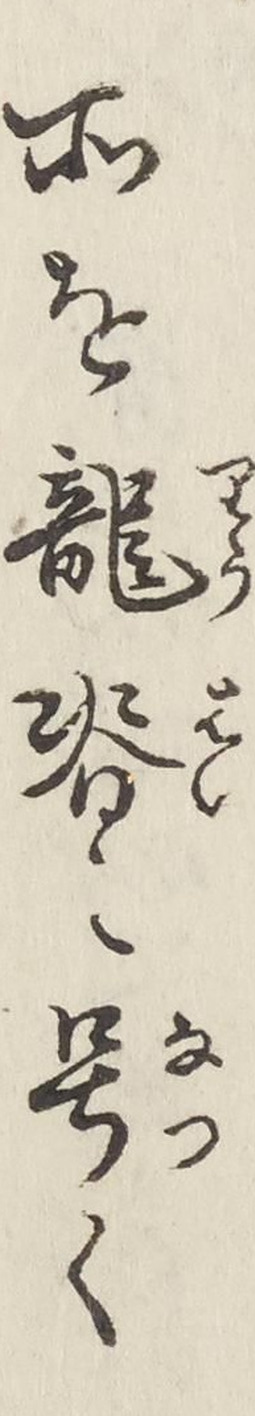所を龍背と号く
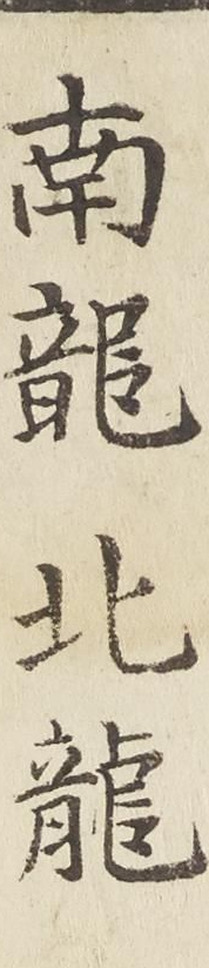南龍北龍
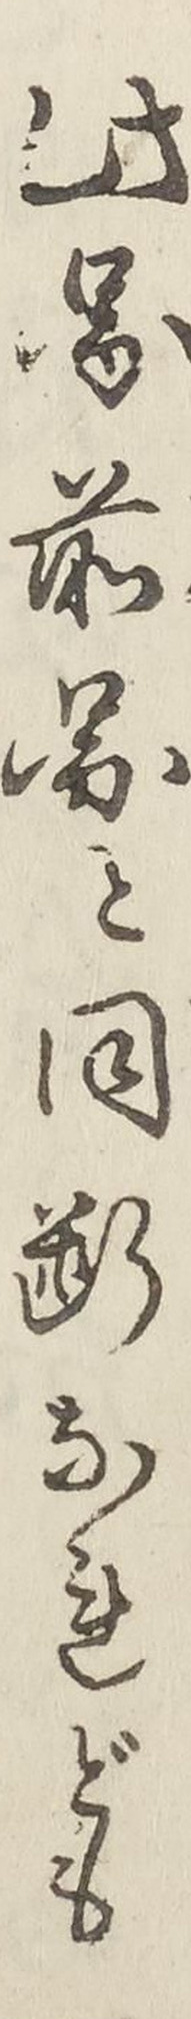此図前図と同断なれども
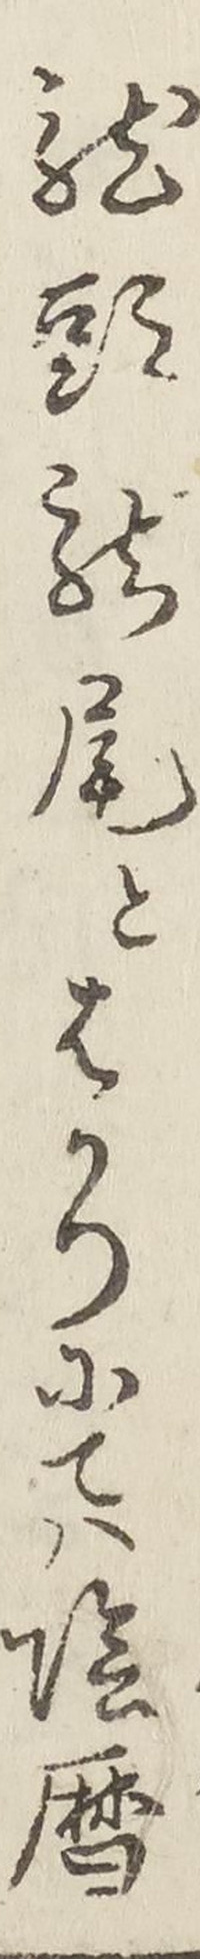龍頭龍尾とはかりにては陰暦
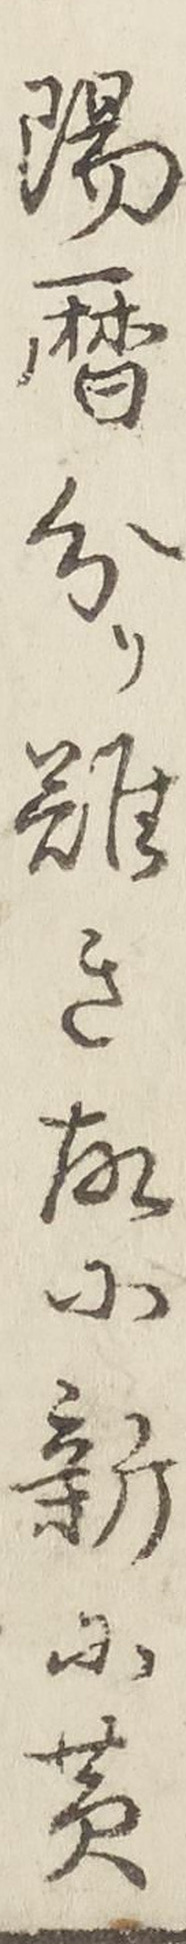陽暦分リ難き故に新に黄
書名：平天儀圖解
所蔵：東京大学地震研究所図書室 Earthquake Research Institute Library, The University of Tokyo, JAPAN
